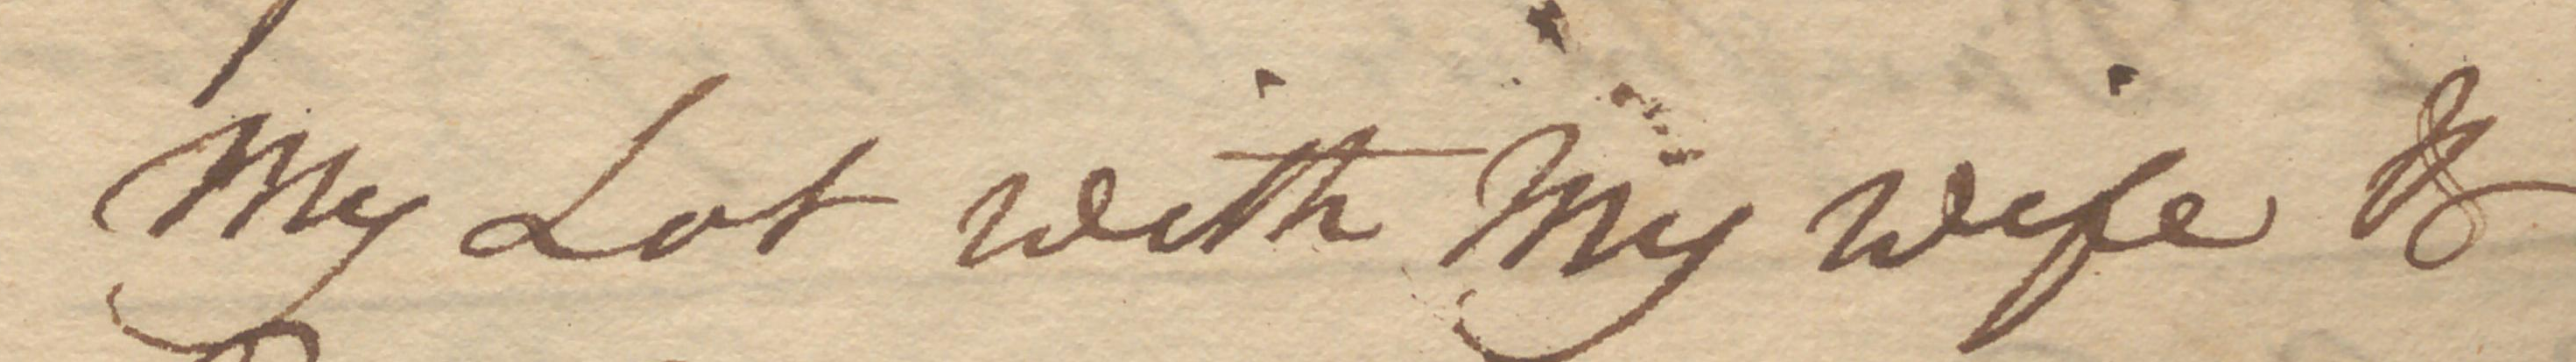My Lot with My wife to
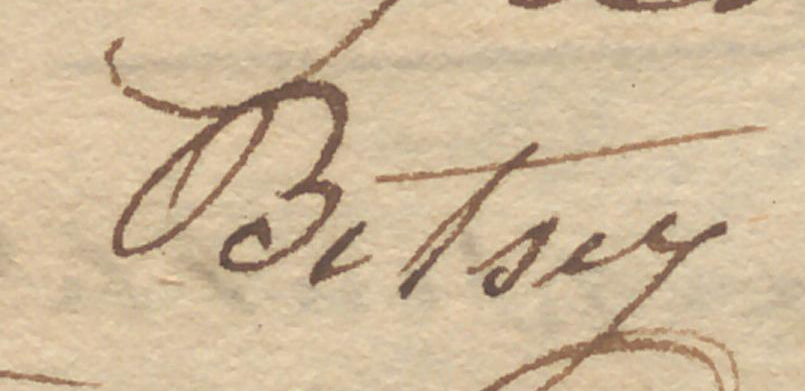Betsey
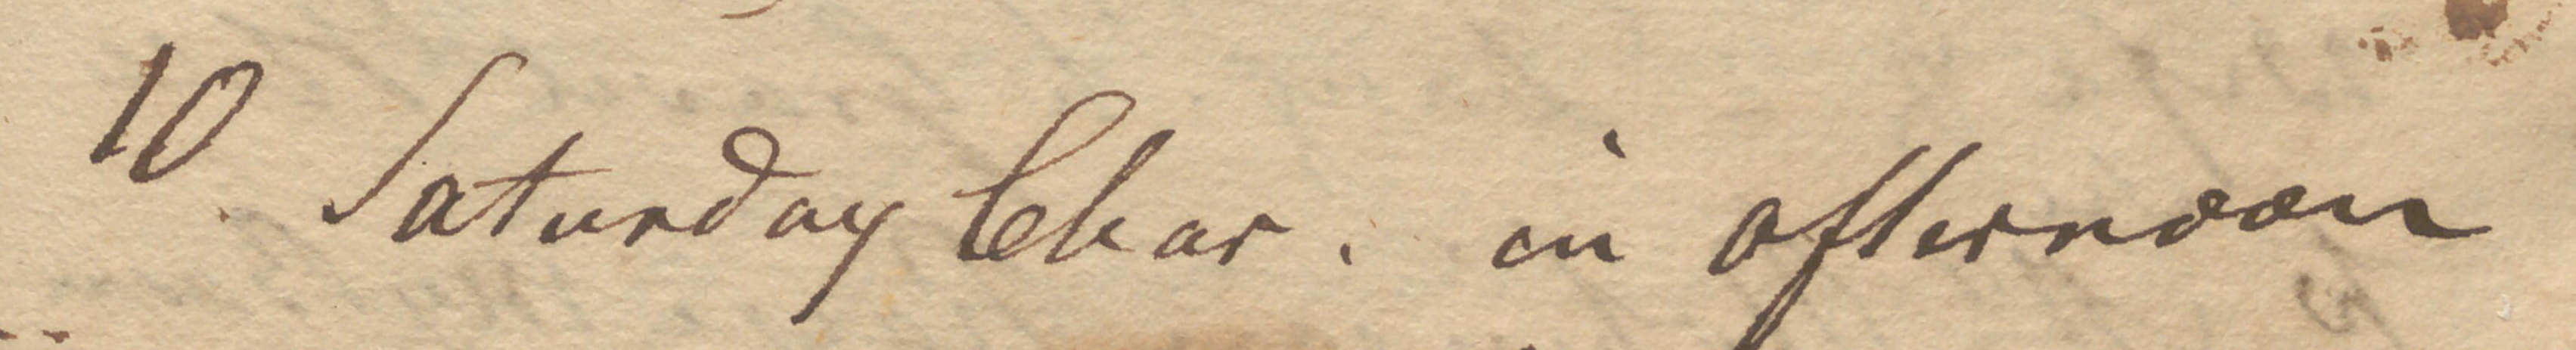Saturday Clear. in afternoon
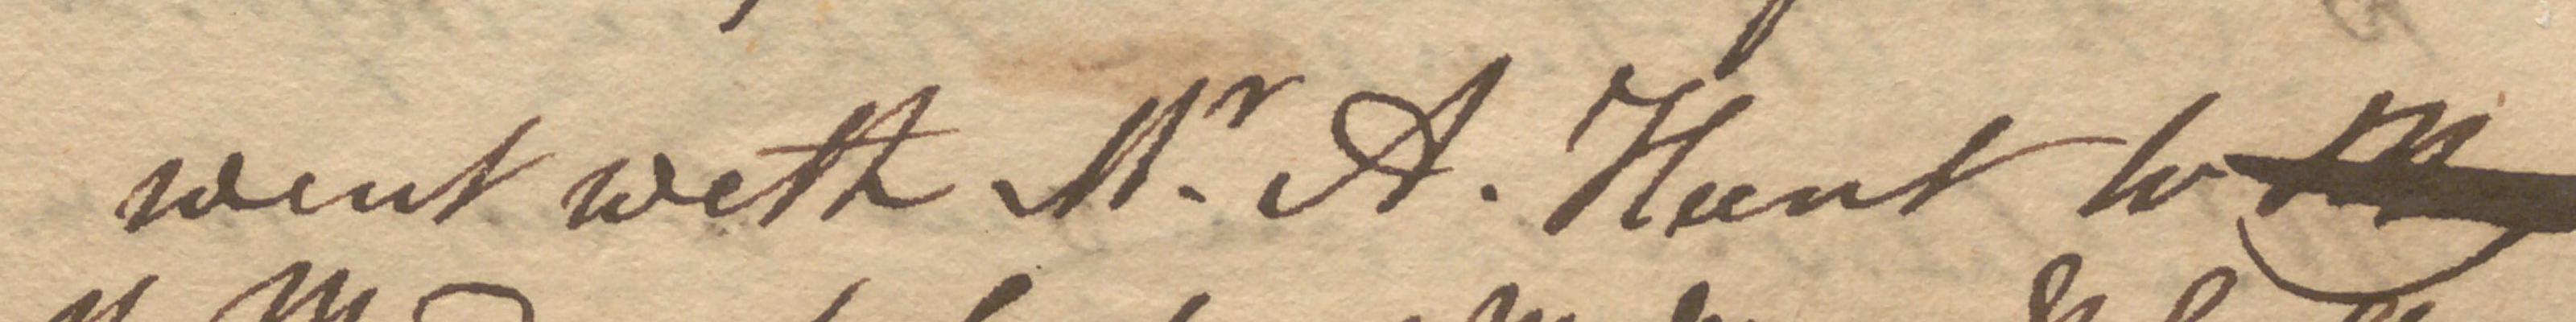went with M^r. A. Hunt to [M_]
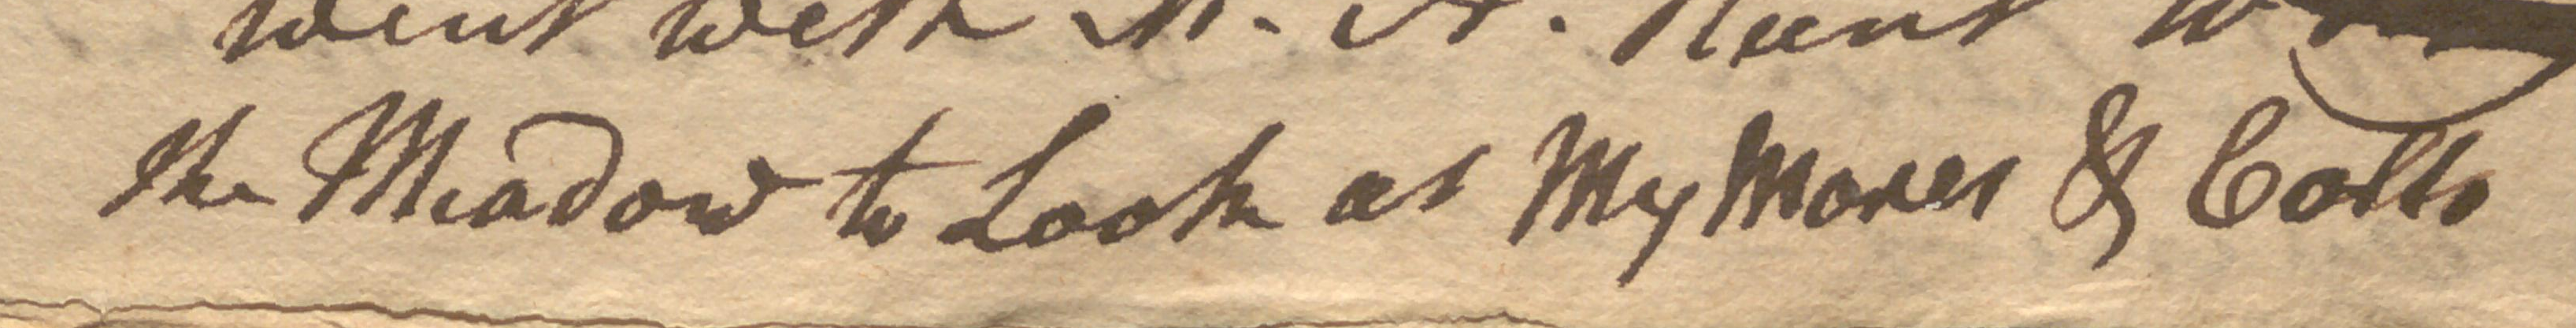the Meadow to Look at My Mares & Colts
